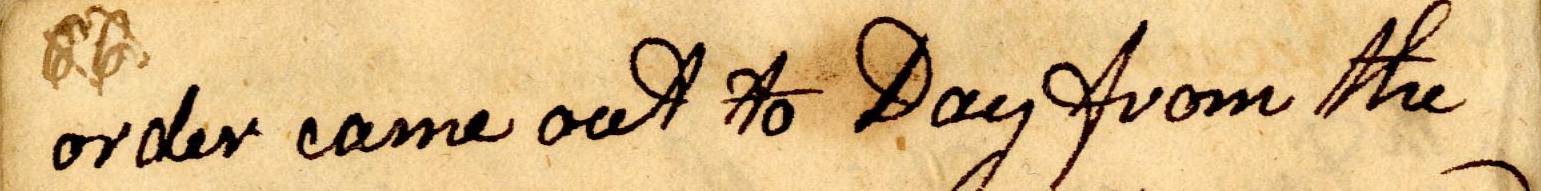order came out to Day from the
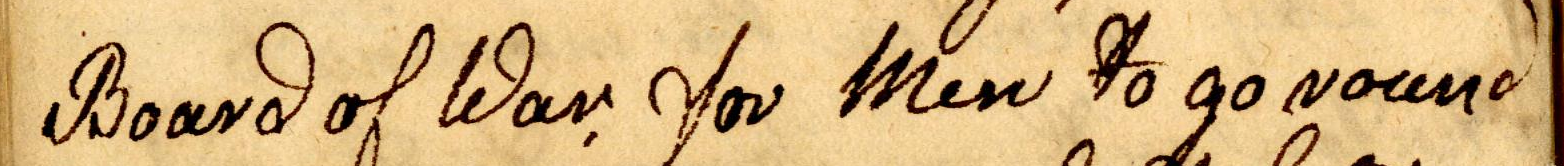Board of War, for Men to go round
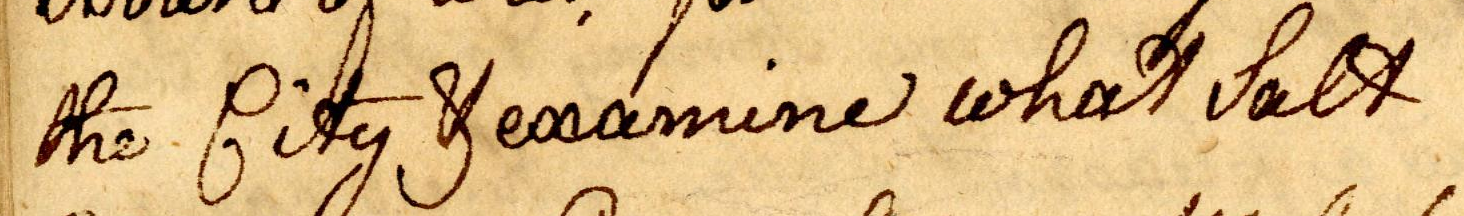the City & examine what Salt
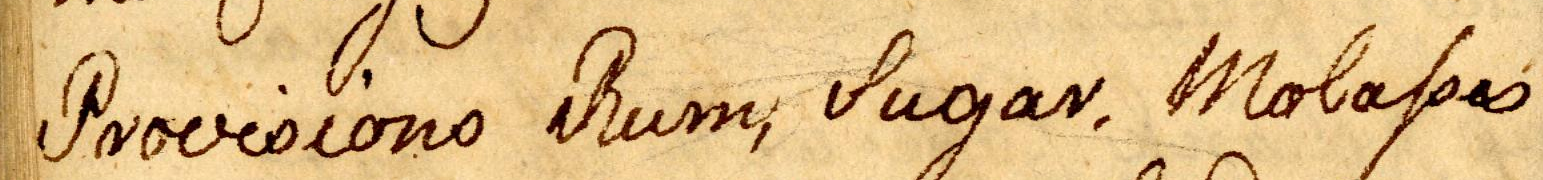Provisions Rum, Sugar, Molassses
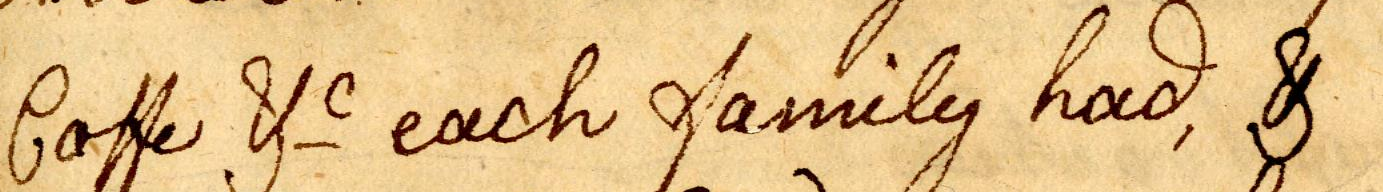Coffe &^c each family had, &
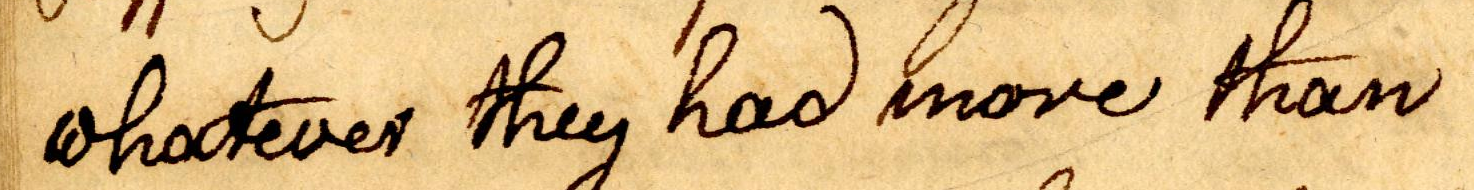whatever they had more than
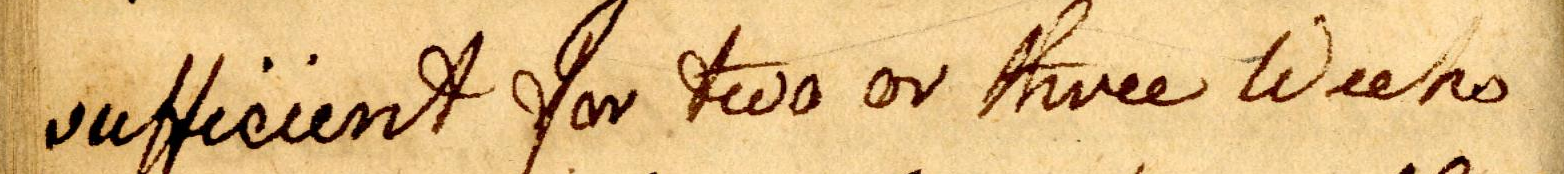sufficient for two or three Weeks
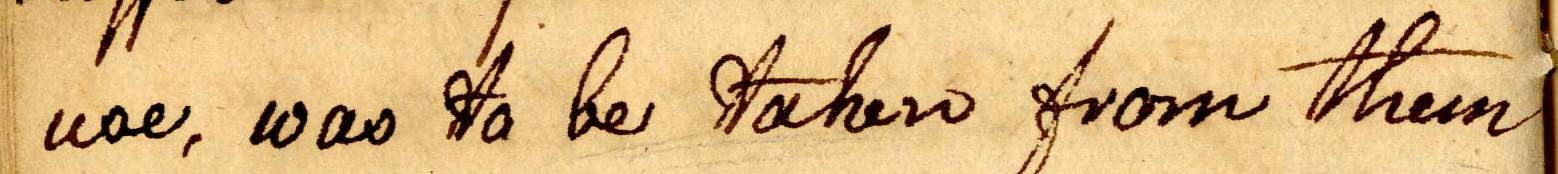use, was to be taken from them
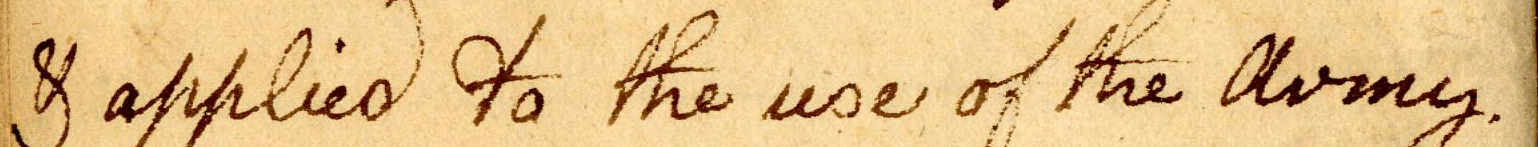& applied to the use of the Army.
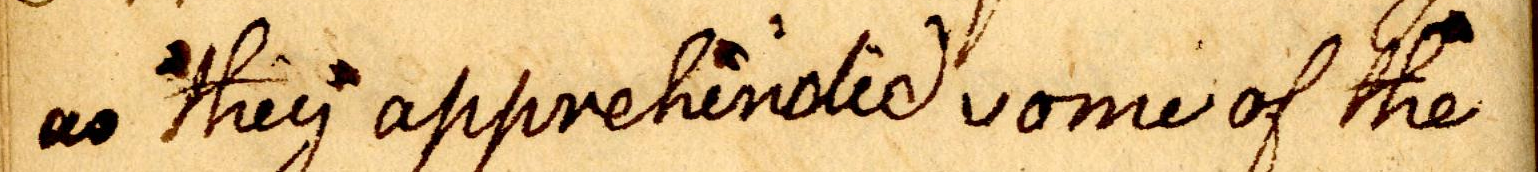as they apprehended some of the
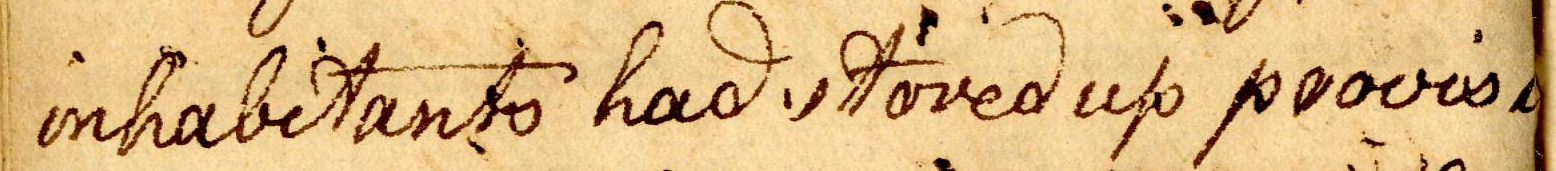inhabitants had stored up provisi
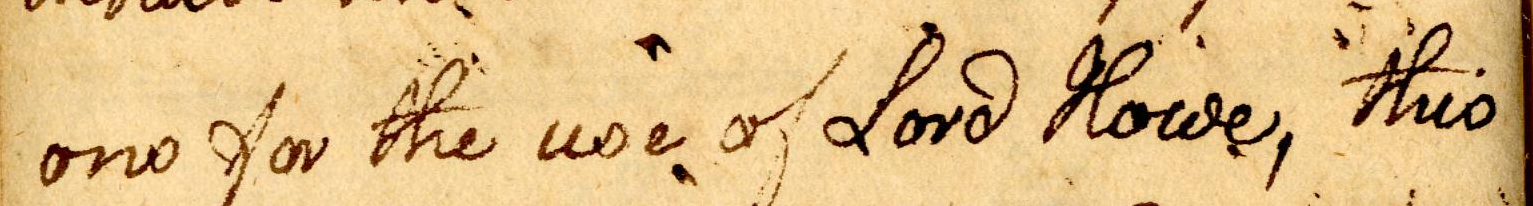ons for the use of Lord Howe, this
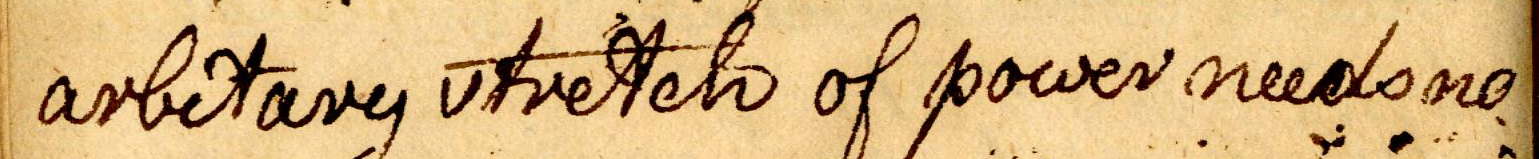arbitary stretch of power needs no
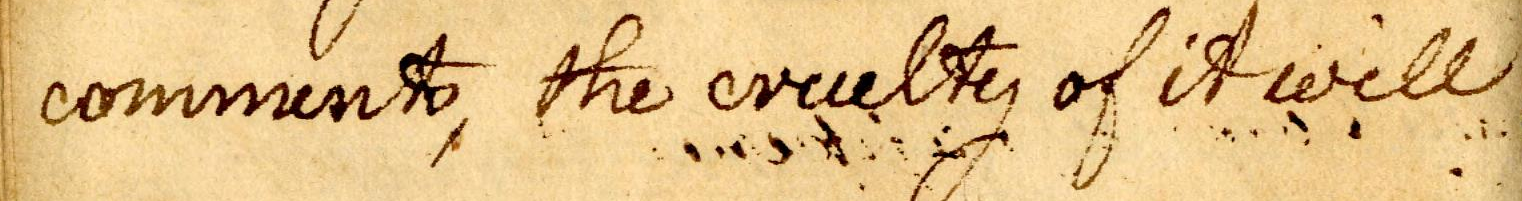comments, the cruelty of it will
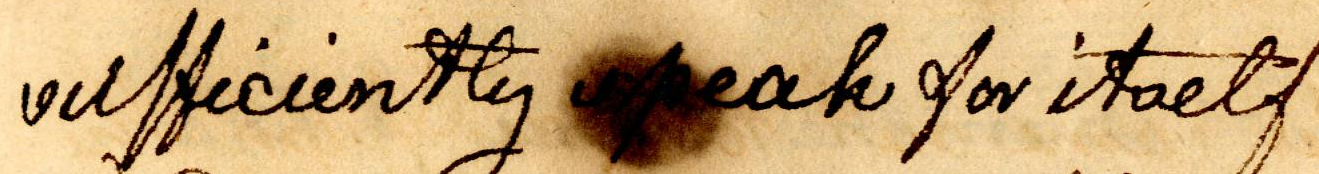sufficiently speak for itself
